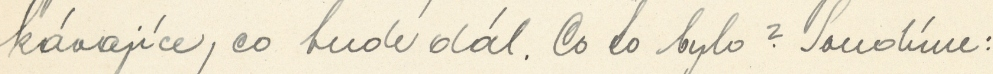kávajíce, co bude dál. Co to bylo? Soudíme:
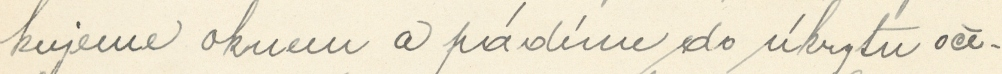kujeme oknem a pádíme do úkrytu oče-
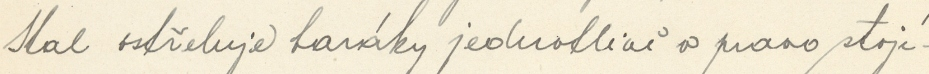Ital ostřeluje baráky jednotlivě v pravo stojí-
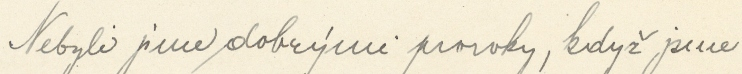Nebyli jsme dobrými proroky, když jsme
